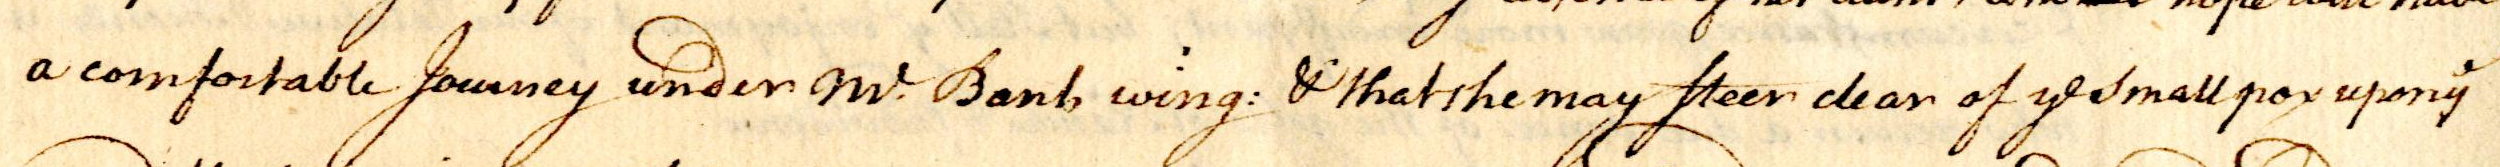a comfortable Journey under M^r. Bants wing: & that she may Steer clear of small pox upon y^e
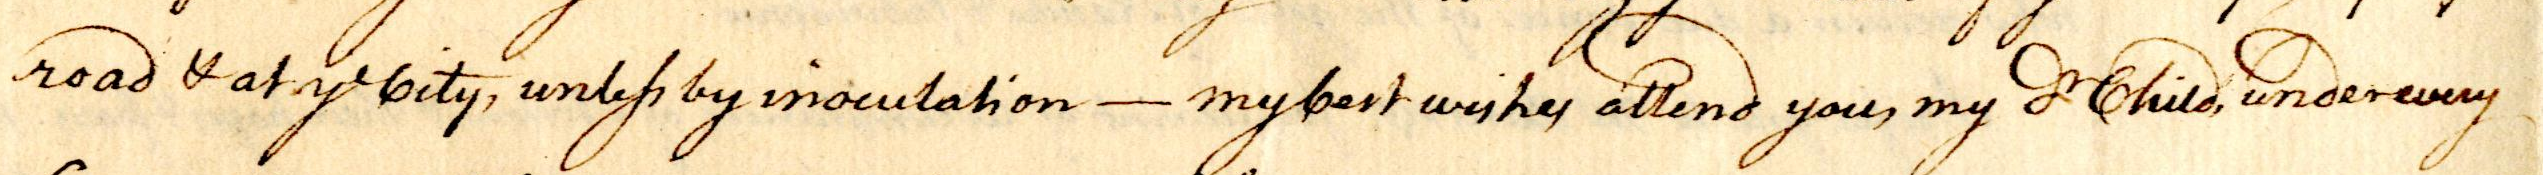road & at y^e city, unless by inoculation- my best wishes attend you, my d^r Child, under every
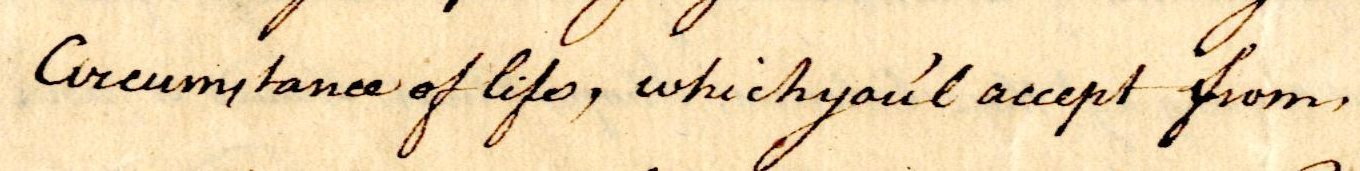Circumstance of life, which you'l accept from.
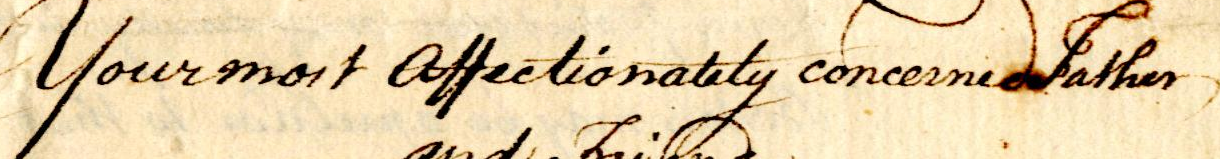Your most Affectionately concerned Father
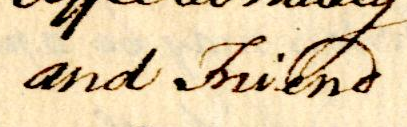and Friend
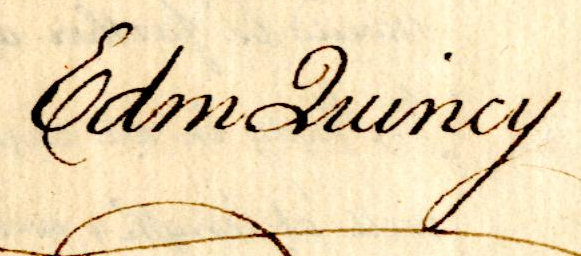Edm Quincy
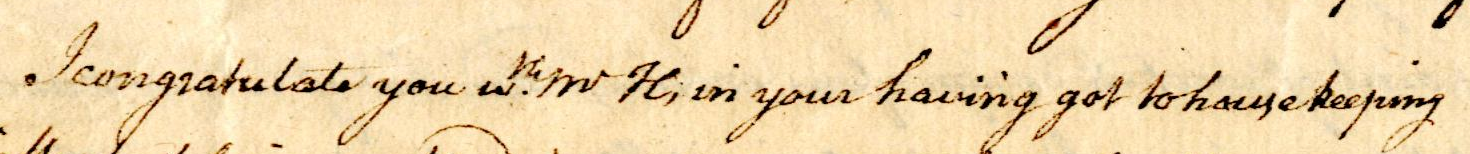I congratulate you w^th. M^r H, in your having got to housekeeping
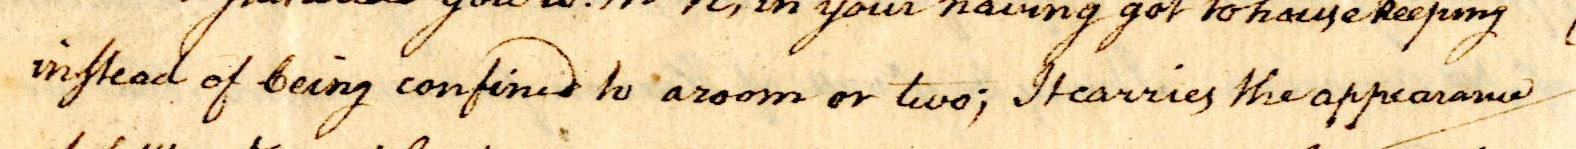instead of being confined to a room or two; It carries the appearance
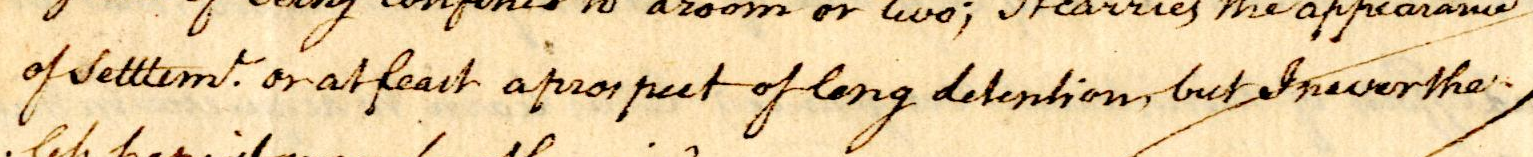of Settlem^t. or at least a prospect of long detention, but I neverthe
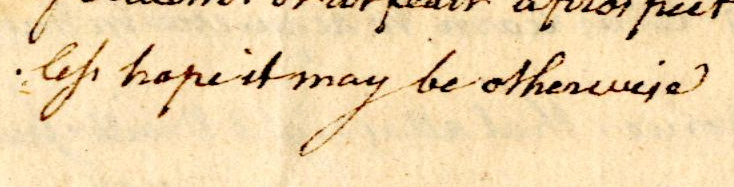-less hope it may be otherwise
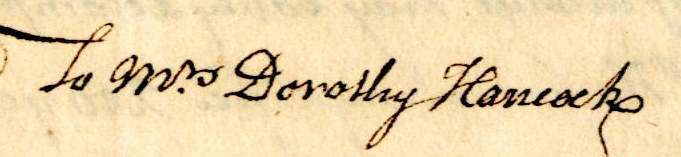To M^rs. Dorothy Hancock
